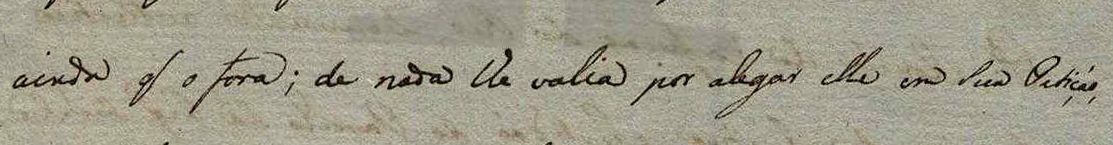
ainda q̄ o fora; de nada lhe valia por alegar elle em Sua Petiçaõ,
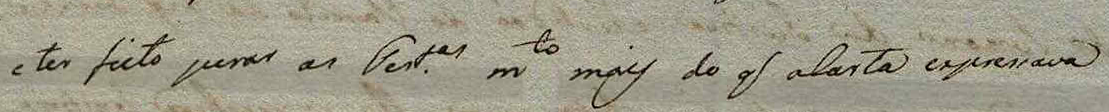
e ter feito jurar as Test.as mto mais do q̄ a Carta expressava
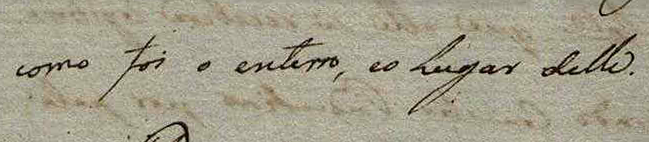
como foi o enterro, e o Lugar delle.
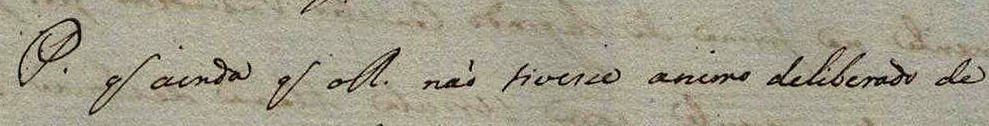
P. q̄ ainda q̄ o R. naõ tivesse animo deliberado de
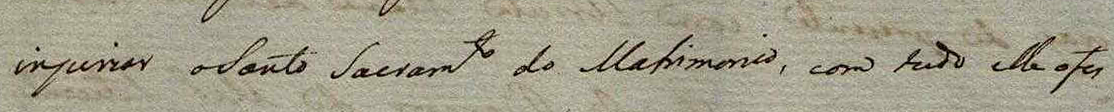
injuriar o Santo Sacramto do Matrimonio, comtudo elle o fes
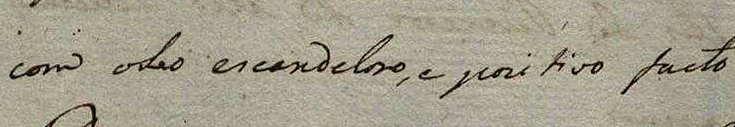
com o Seo escandelozo, e pozitivo facto
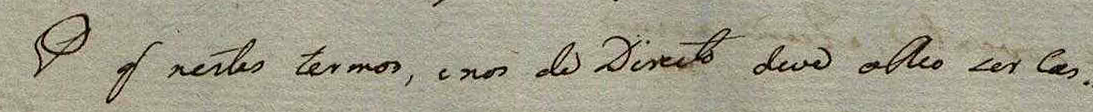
P q̄ nestes termos, e nos de Direito deve o Reo ser Cas
